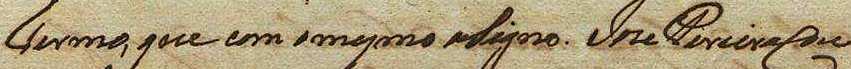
Termo, que com o mesmo asigno. Ioze Pereira Cou
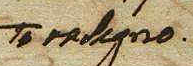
to o asegno.
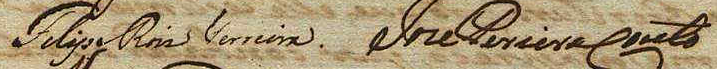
Felipe Roiz Ferreira. Ioze Pereira Couto
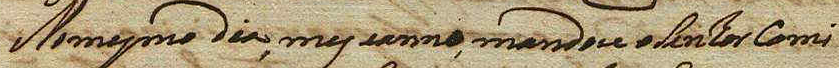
No mesmo dia mes e anno, mandou o Senhor Comi
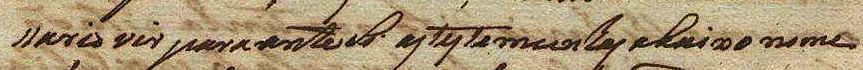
ssario vir paraantte si as testemunhas abaixo nome
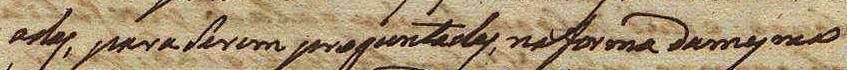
adas, para serem proguntadas, na forma da mesma
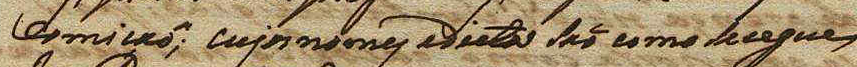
Comiçaõ; cujos nomes adicta saõ como se cegue
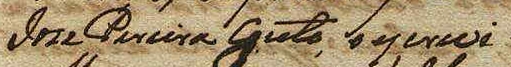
Ioze Pereira Couto, o escrevi
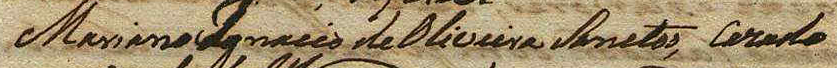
Mariano Ignacio de Oliveira Sanctos, cazado
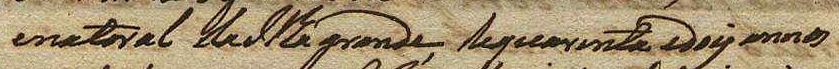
e natoral da Ilha grande, de quarenta e dois annos
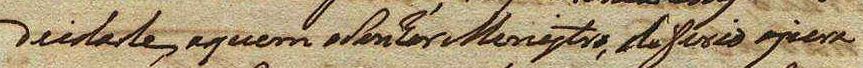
de idade, a quem o Senhor Menistro, deferio o jura
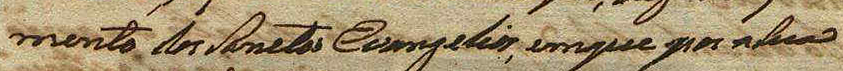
mento dos Sanctos Evangelios, em que pos a sua
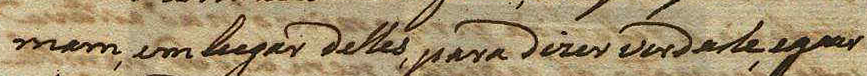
mam, em lugar delles, para dizer verdade, e guar
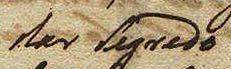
dar Segredo
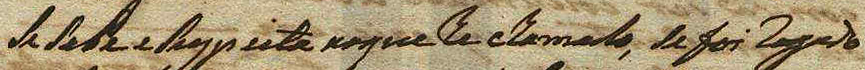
se sabe e suspeita ao que he chamado, se foi Rogado
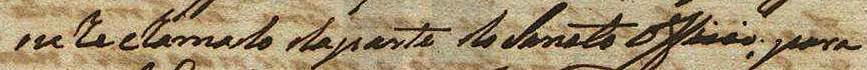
ou he chamado da parte do Sancto Officio; para
